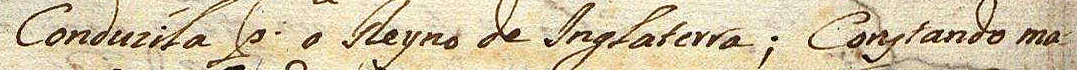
Conduzíla p.a o Reyno de Inglaterra; Constando ma
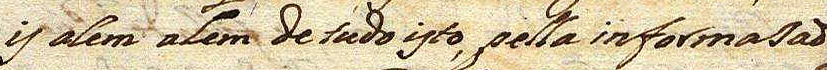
is alem alem de tudo isto, pella informasaõ
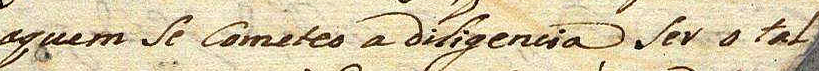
a quem se cometeo a diligencia, ser o tal
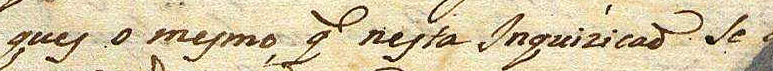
ques o mesmo, q̄ nesta Inquizicaõ se
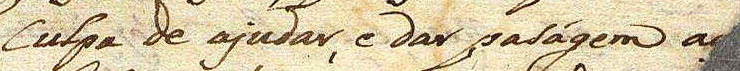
Culpa de ajudar, e dar paságem a
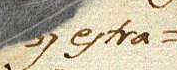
s estra
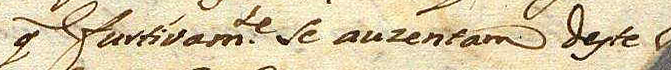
q̄ furtivam.te se auzentam deste
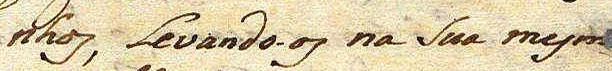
nhos, Levando-os na sua mesm
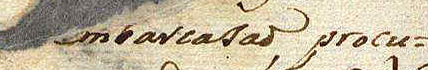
mbarcasaõ, procu
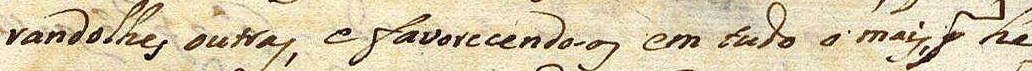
randolhes outras, e favorecendo-os em tudo o mais, q̄ he
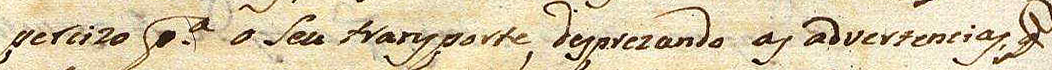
percizo p.a o seu transporte, desprezando as advertencias, q̄
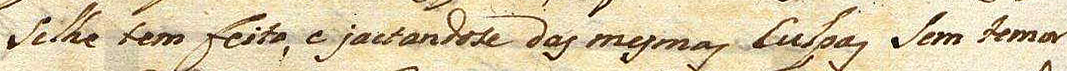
se lhe tem feito, e jactandose das mesmas Culpas sem temor
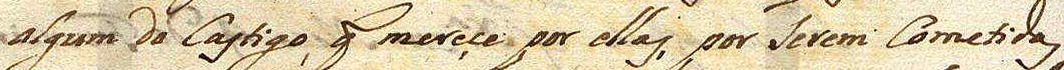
algum do Castigo, q̄ mereçe por ellas, por serem Cometidas
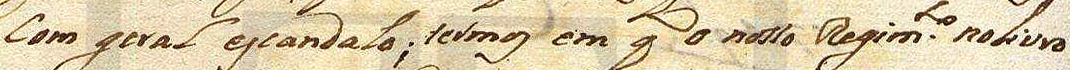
Com geral escandalo; termos em q̄ o nosso Regim.to no Livro
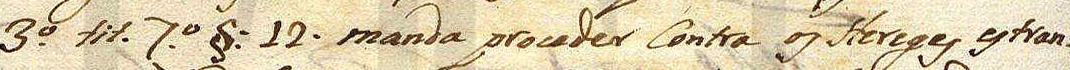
3.o tit. 7.o §: 12. manda proceder Contra os Hereges estran
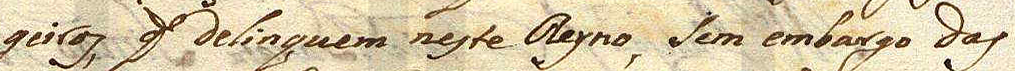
geiros q̄ delinquem neste Reyno, sem embargo das
